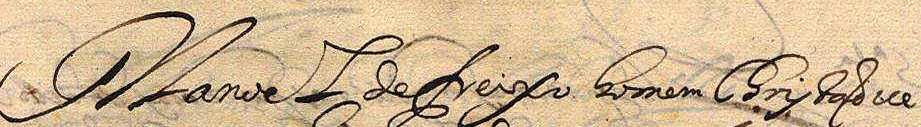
ManoeL de freixo homem Christaõ ue
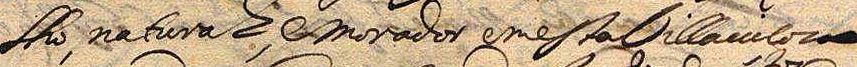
lho, natural, e morador em esta Villa uiçoza
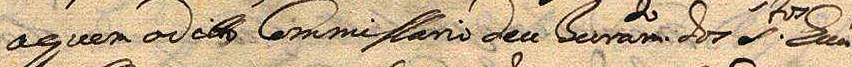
a quem o ditto Commissario deu Iuramto. dos S.tos Euā
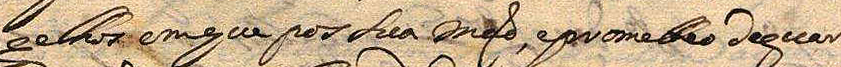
gelhos em que pos sua maõ, e prometteo de guar
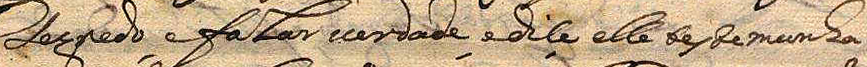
segredo, e falar uerdade, e diçe elle testemunha
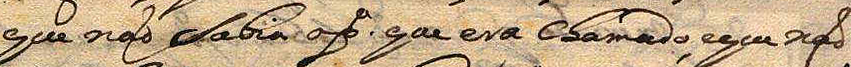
que não sabia o pa. que era chamado, e que naõ
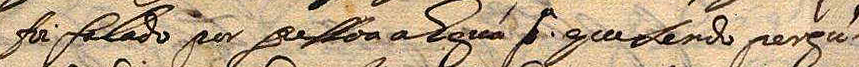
foi falado por pessoa alguā pa. que sendo pergū
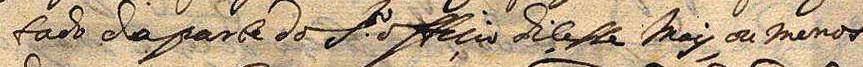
tado da parte do sto. offiçio diçesse mais, ou menos
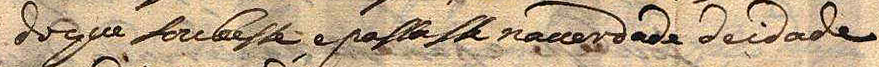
do que soubesse, e passasse na uerdade de idade
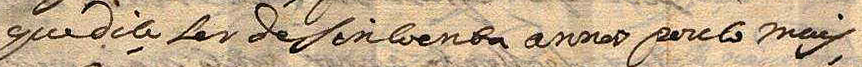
que diçe ser de Sincoenta annos pouco mais,
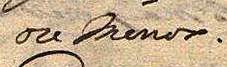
ou menos.
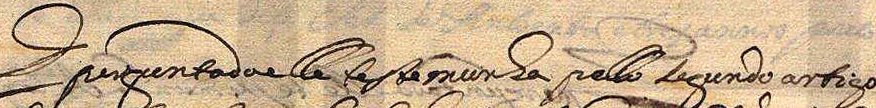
E perguntado elle testemunha pello segundo artigo
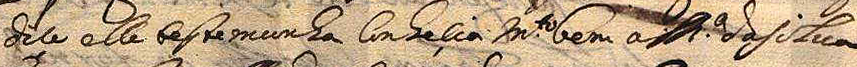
diçe elle testemunha Conheçia m.to bem a M.a da Silua
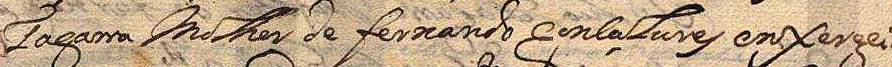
Tagarra Molher de fernando gonçalures enxergei
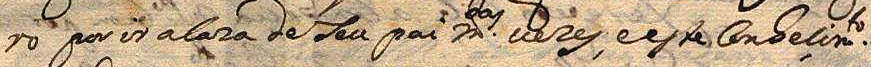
ro por ir a caza de seu pai mtas. uezes, e este conheçimto.
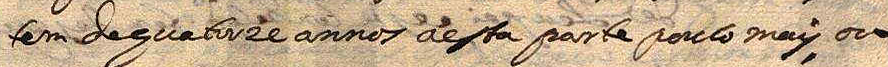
tem de quatorze annos a esta parte pouco mais, ou
